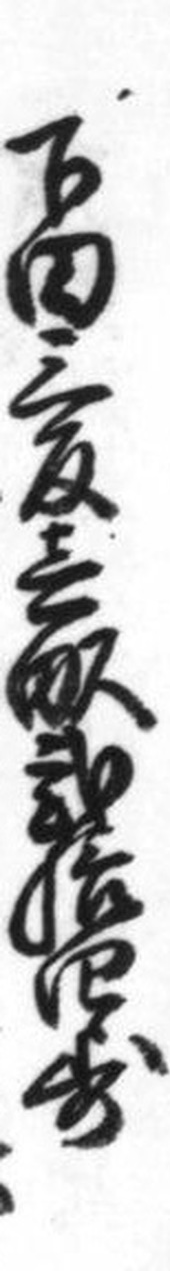下田三反壱畝弐拾四歩
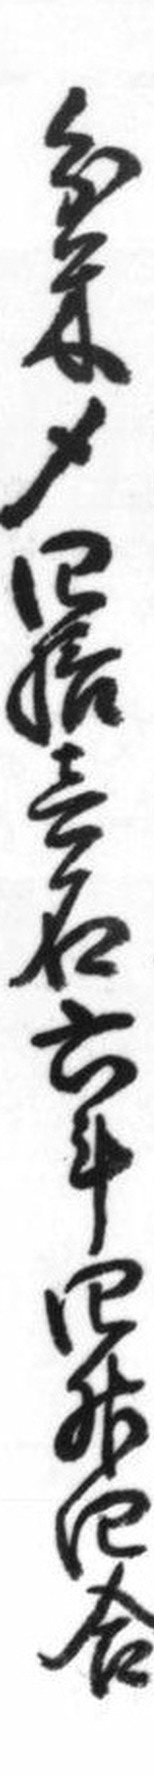分米〆四拾壱石六斗四升四合
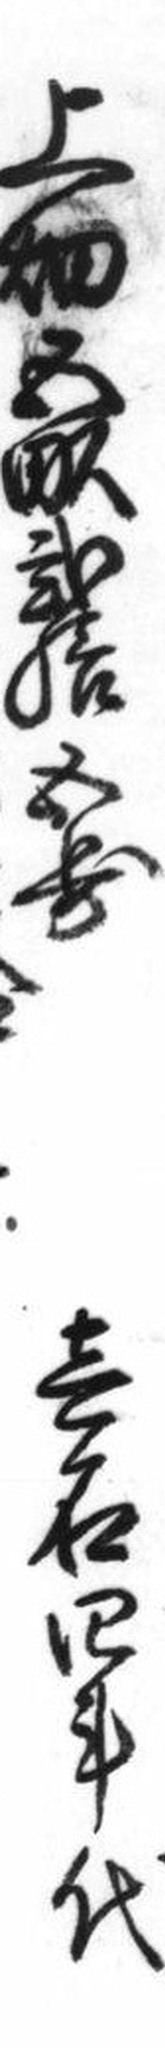上畑五畝弐拾五歩壱石四斗代
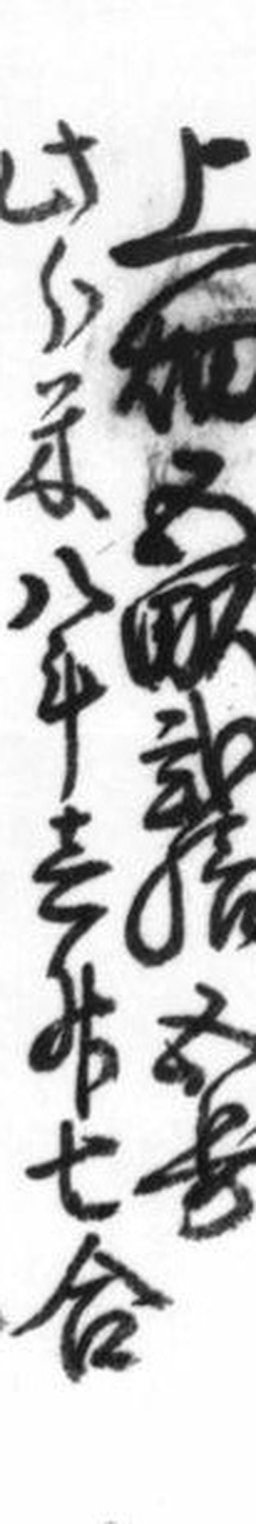此分米八斗壱升七合
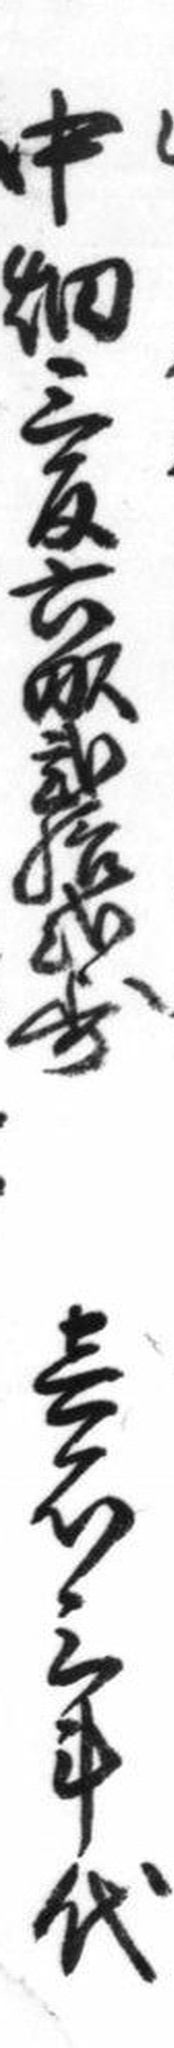中畑三反六畝弐拾弐歩壱石三斗代
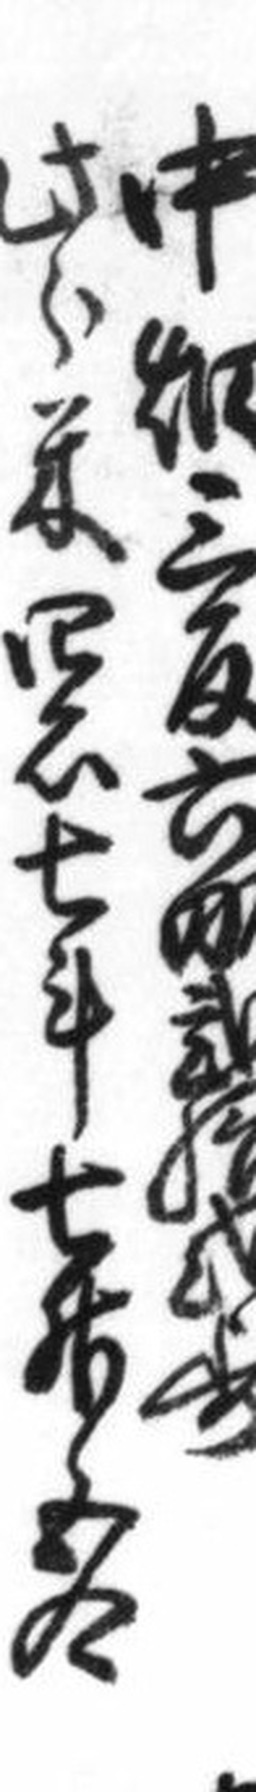此分米四石七斗七升五合
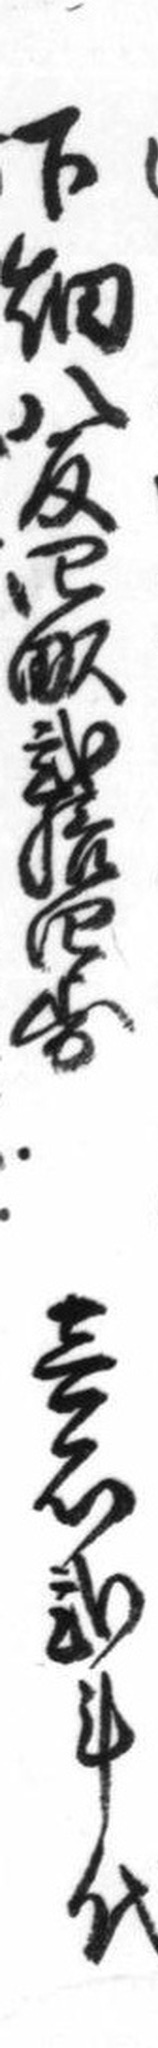下畑八反四畝弐拾四歩壱石弐斗代
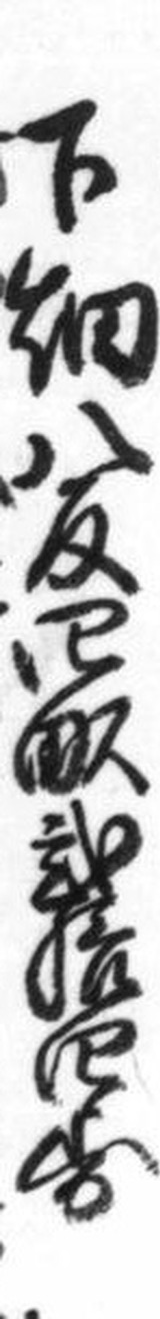下田三反壱畝弐拾四歩
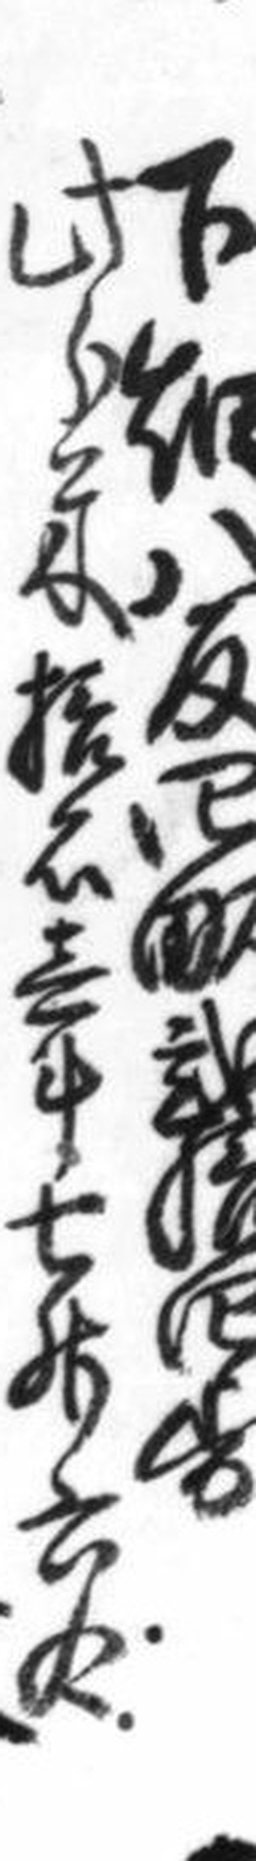此分米拾石壱斗七升六合
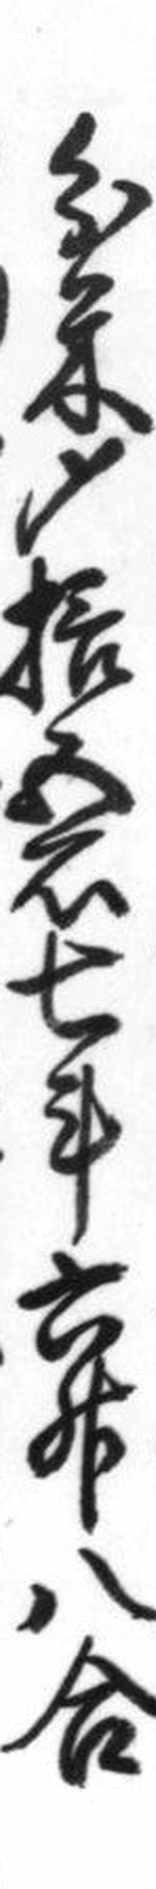分米〆拾五石七斗六升八合
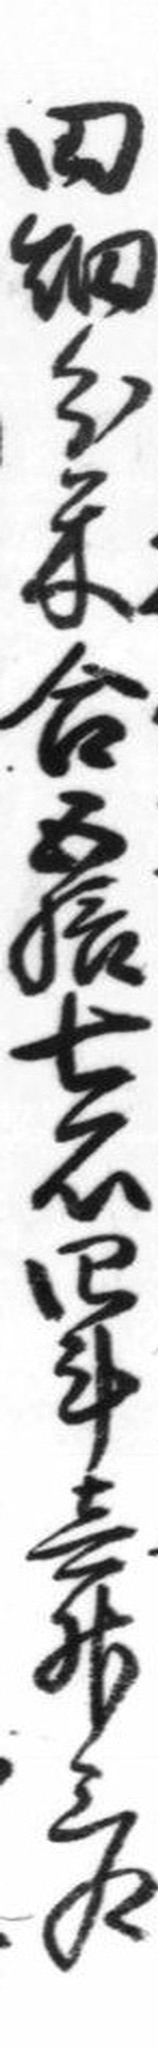田畑分米合五拾七石四斗壱升三合
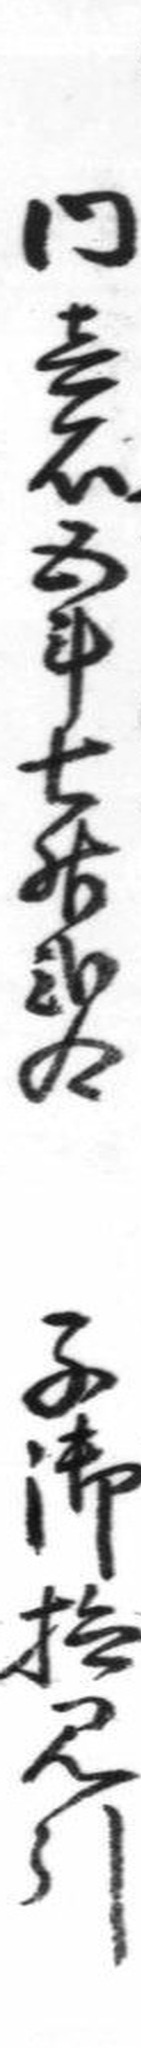内壱石五斗七升弐合子御検見引
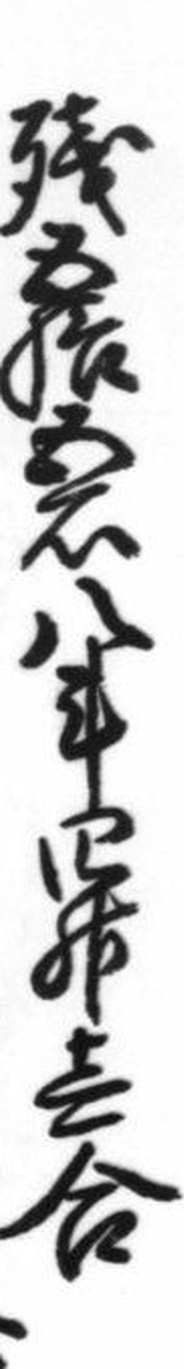残五拾五石八斗四升壱合有高
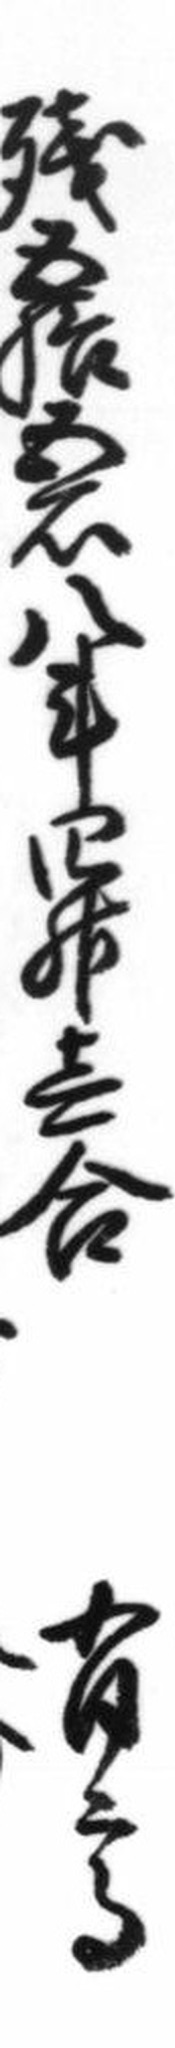残五拾五石八斗四升壱合有高
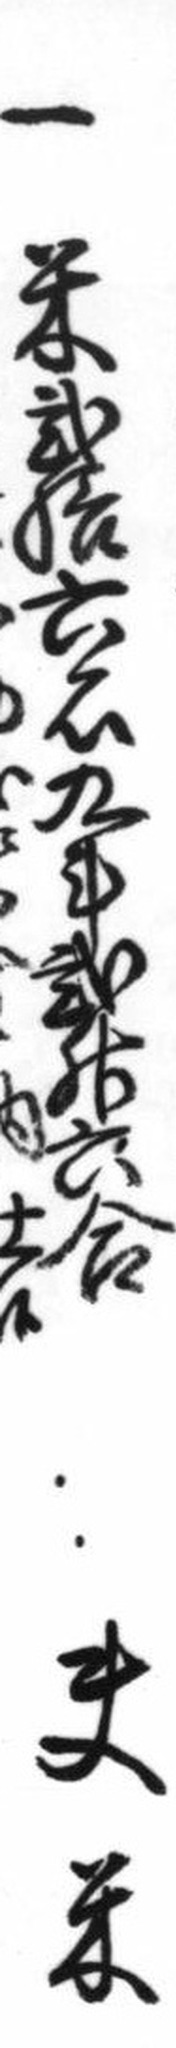一米弐拾六石九斗弐升六合夫米
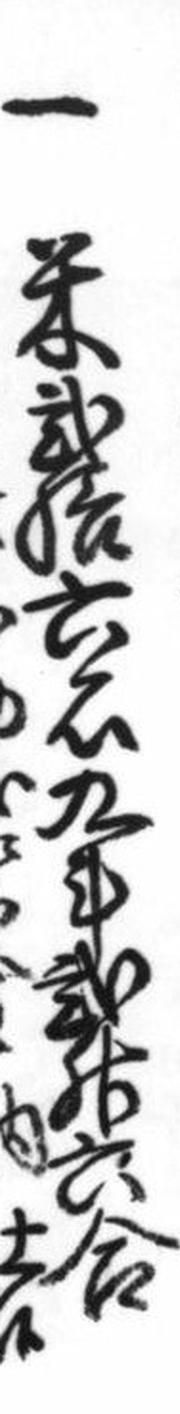一米弐拾六石九斗弐升六合夫米
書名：越前国大野郡今井村明細帳
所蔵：福井県文書館 Fukui Prefectural Archives
